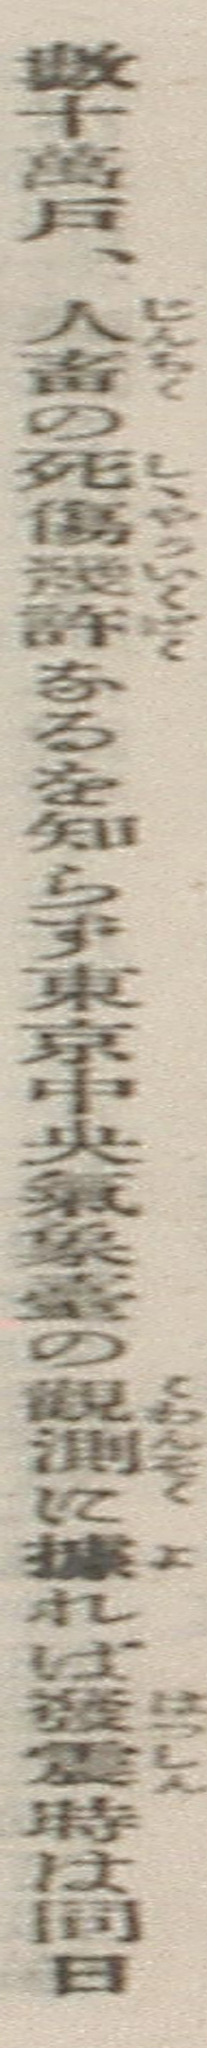数十萬戸、人畜の死傷幾許なるを知らず東京中央気象台の観測に拠れば発震時は同日
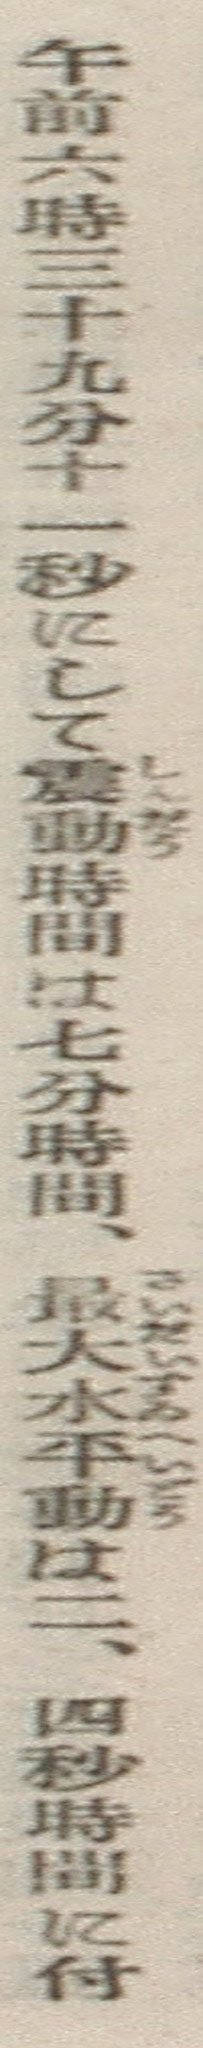午前六時三十九分十一秒にして震動時間は七分時間、最大水平動は二、四秒時間に付
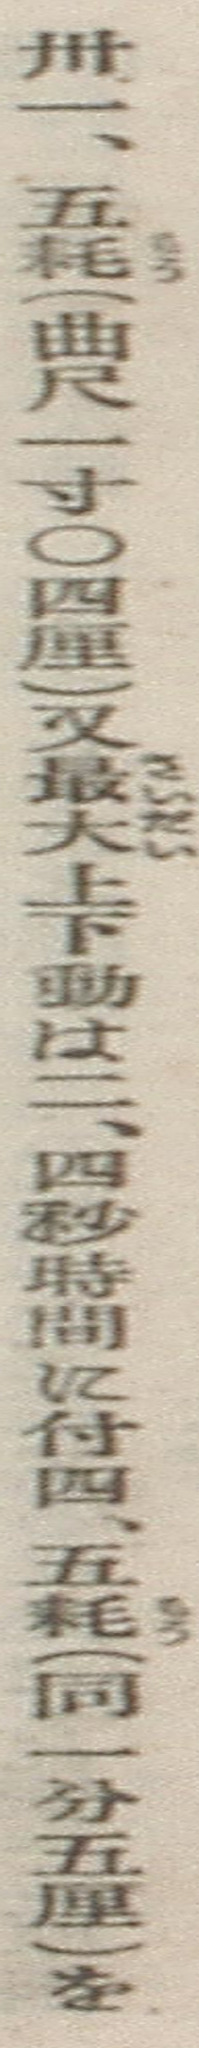卅一、五耗又最大上下動は二、四秒時間に付四、五耗を
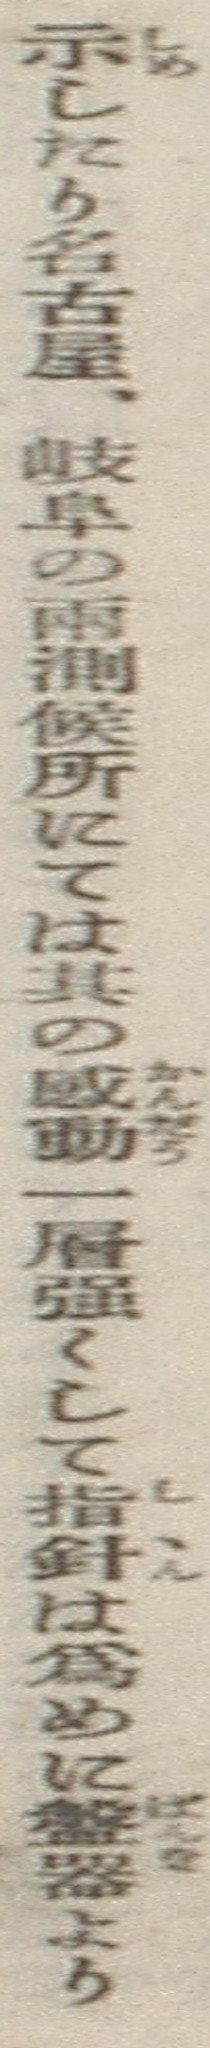示したり名古屋、岐阜の両測候所にてはその感動一層強くして指針は為めに盤器より
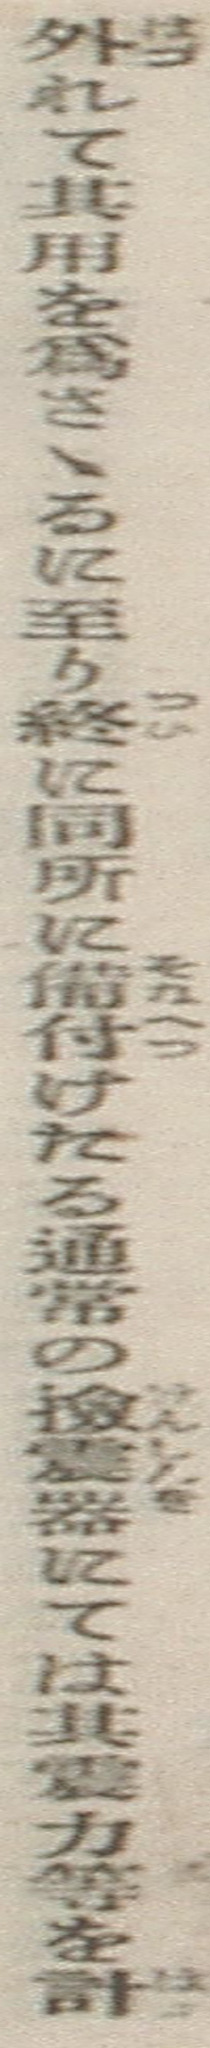外れて其用を為さゝるに至り終に同所に備付けたる通常の検震器にては其震力等を計
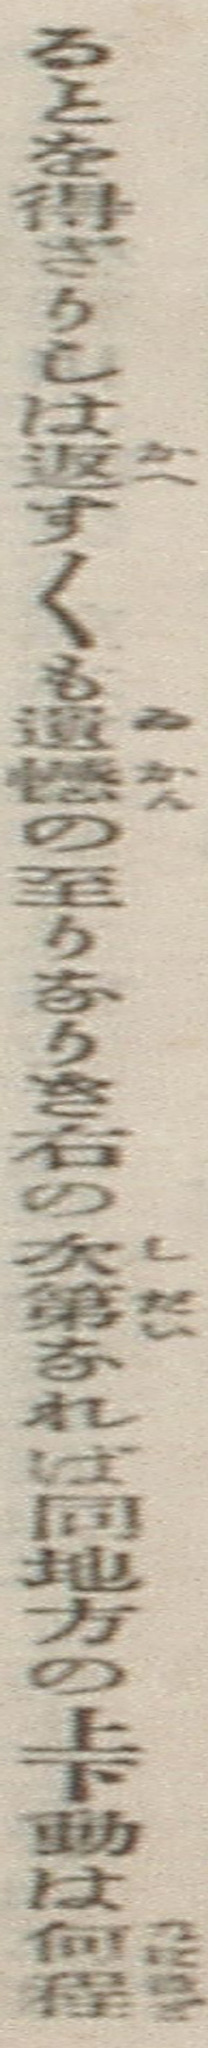ることを得ざりしは返す〳〵も遺憾の至りなりき右の次第なれば同地方の上下動は何程
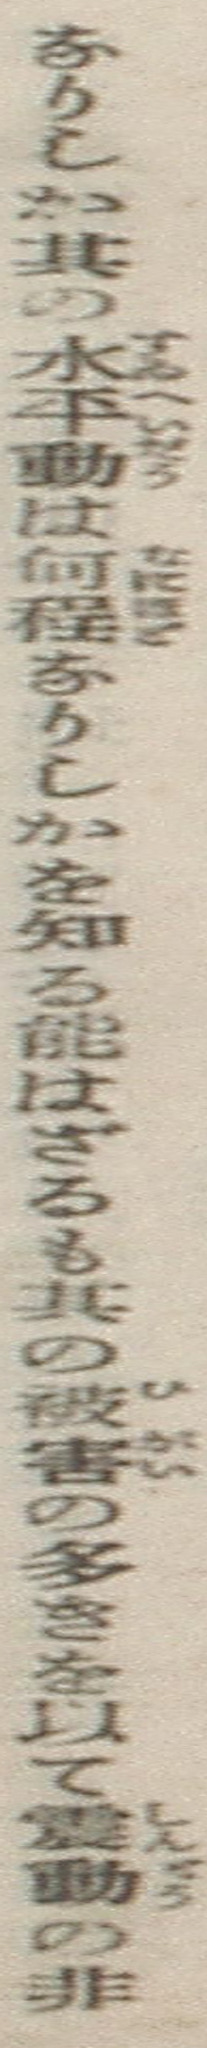なりしか其の水平動は何程なりしかを知る能はざるも其の被害の多きを以て震動の非
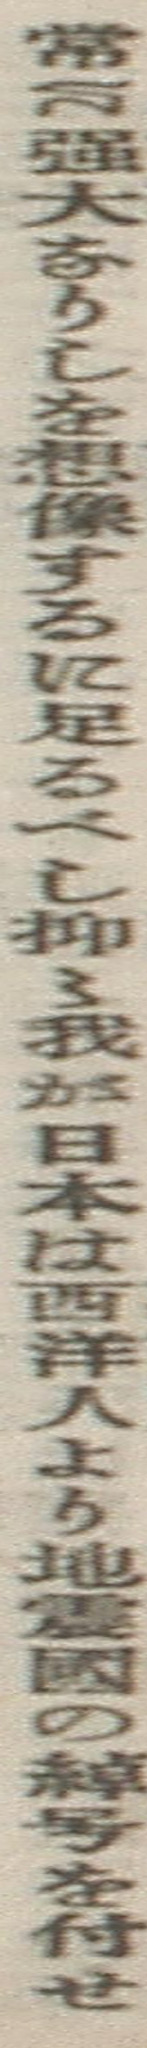常に強大なりしを想像するに足るべし抑〻我が日本は西洋人より地震国の綽号を付せ

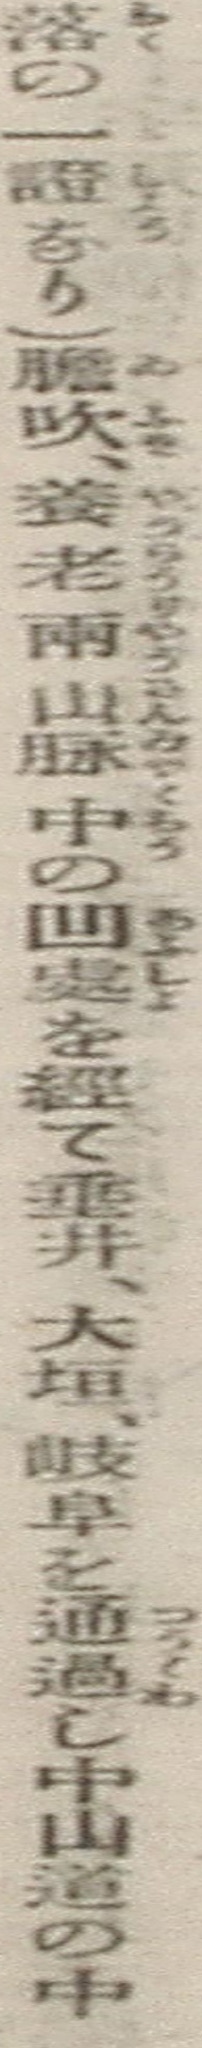落の一證なり）膽吹、養老両山脈中の凹処を経て垂井、大垣、岐阜を通過し中山道の中
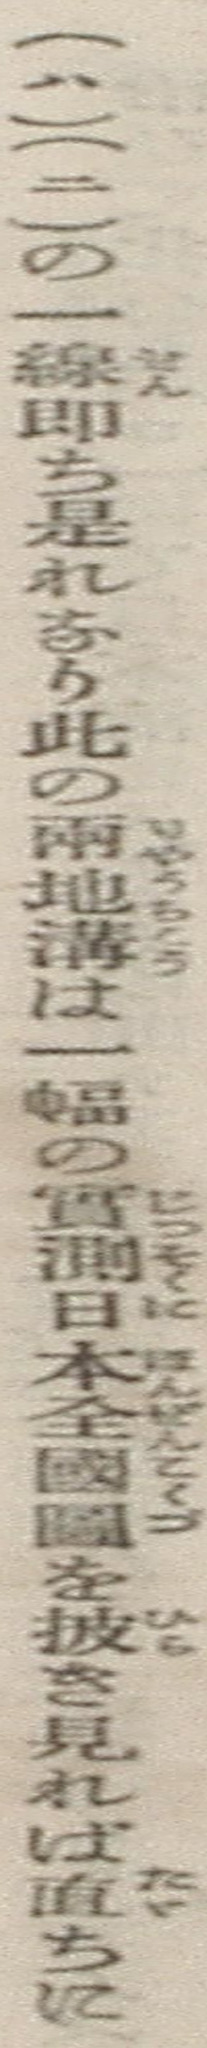の一線せん即ち是れなり此の両地溝は一幅の実測日本全国図を披き見れば直ちに
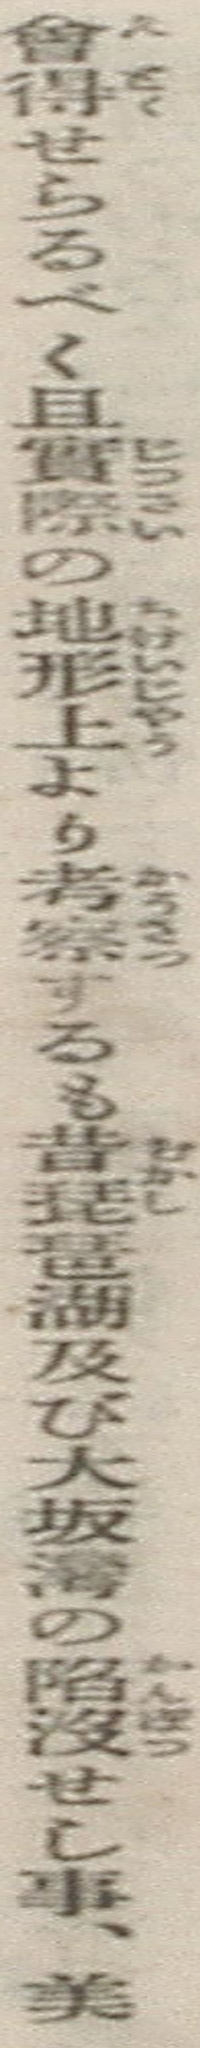会得せらるべく且実際の地形上より考察するも昔琵琶湖及び大坂湾の陥没せし事、美
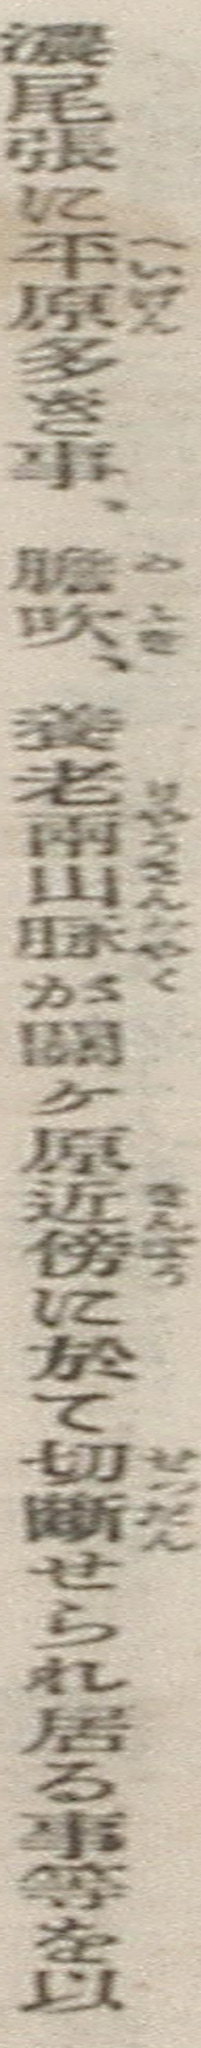濃尾張に平原多き事、膽吹、養老両山脈が関ヶ原近傍に於て切断せられ居る事等を以
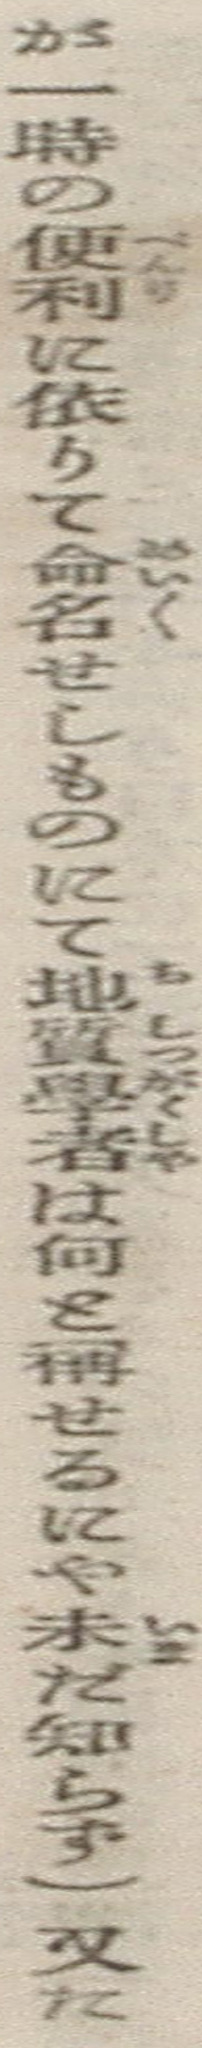が一時の便利に依りて命名せしものにて地質学者は何と称せるにや未だ知らず）又た
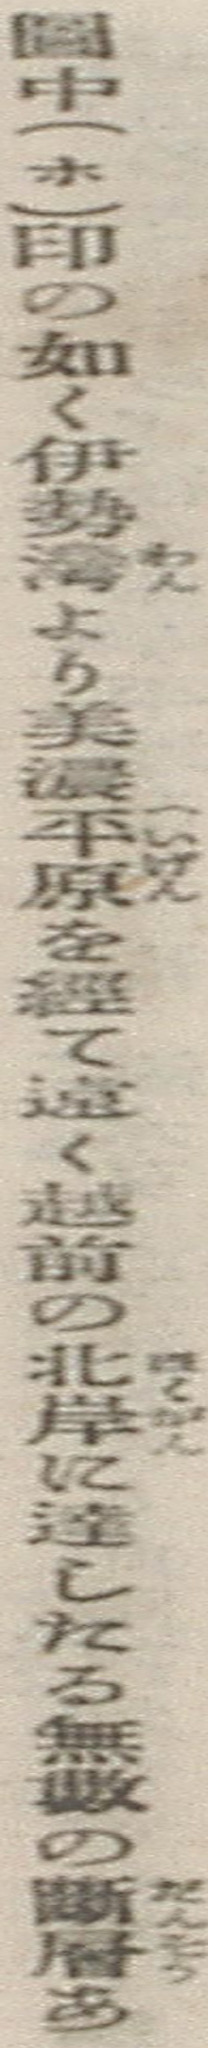図中印の如く伊勢湾より美濃平原を経て遠く越前の北岸に達したる無数の断層あ
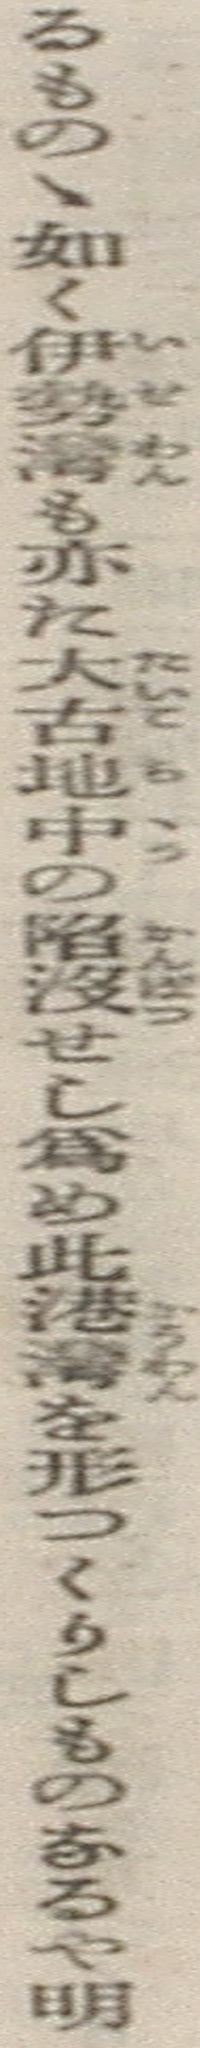るものゝ如く伊勢湾も亦た大古地中の陥没せし為め此港湾を形つくりしものなるや明
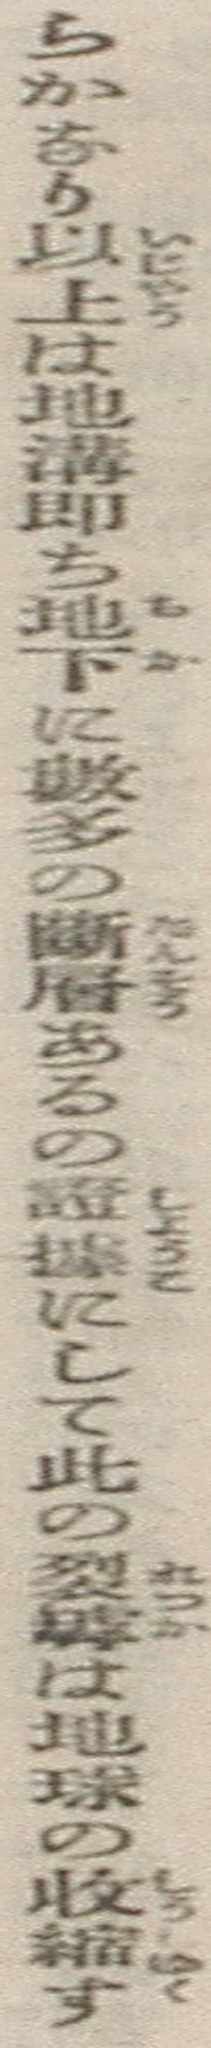らかなり以上は地溝即ち地下に数多の断層あるの証拠にして此の裂罅は地球の収縮す
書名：愛知岐阜福井三県　大地震見聞録（内題）
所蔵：東京大学地震研究所図書室 Earthquake Research Institute Library, The University of Tokyo, JAPAN
